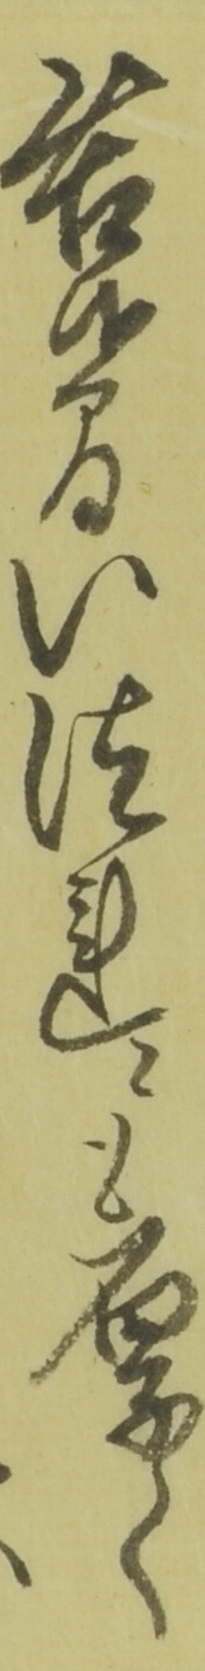苦候間いつれニも厚く
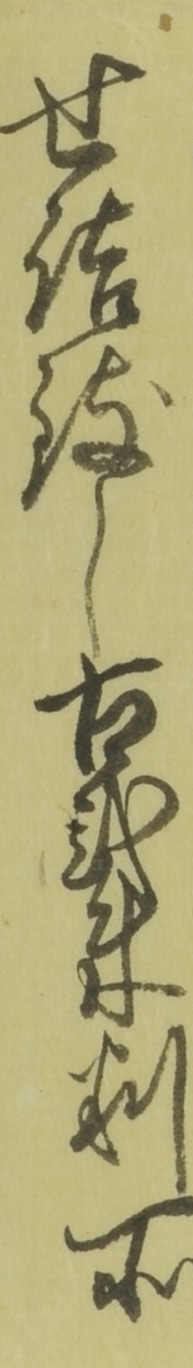世話致し古弐朱判所
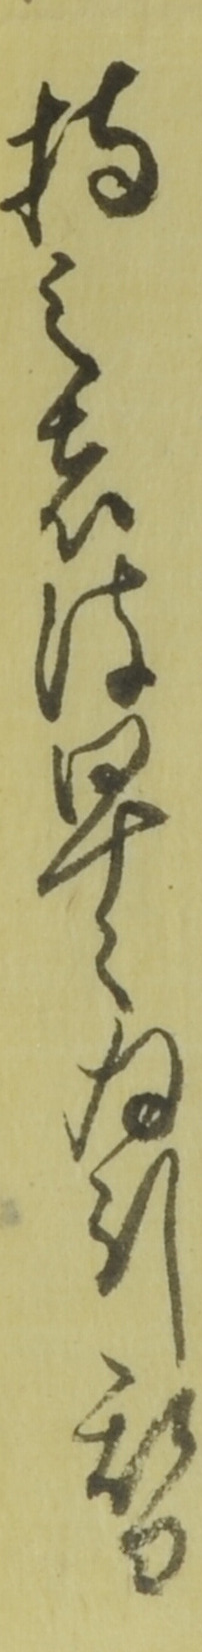持之者は早々為引替
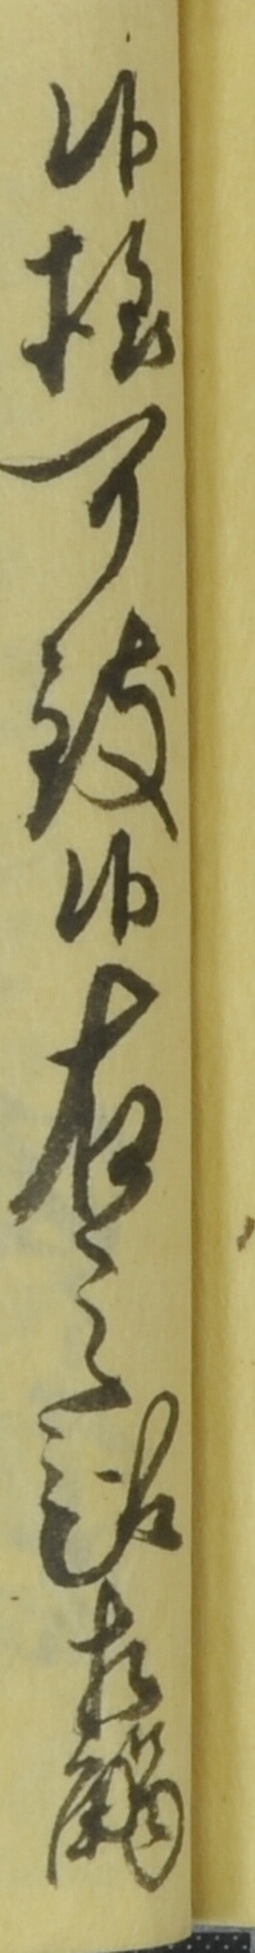候様可致候右之趣相触
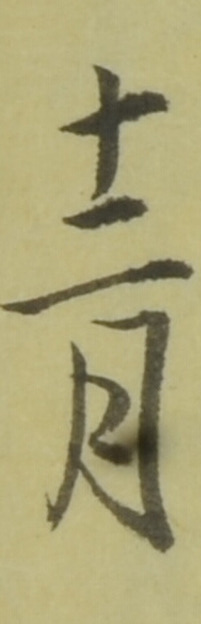十二月

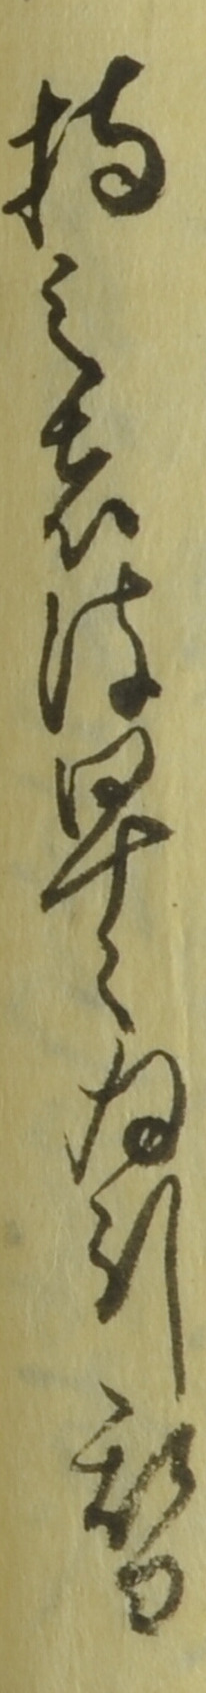持之者は早々為引替
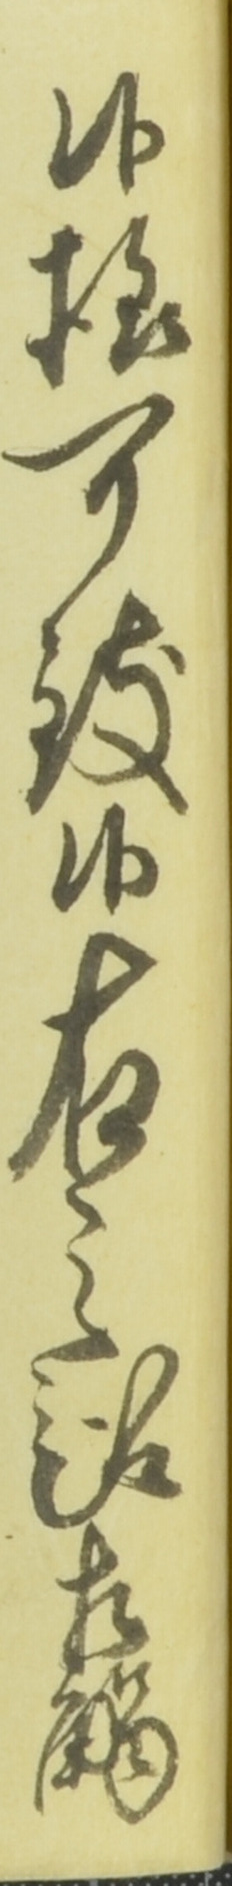候様可致候右之趣相触
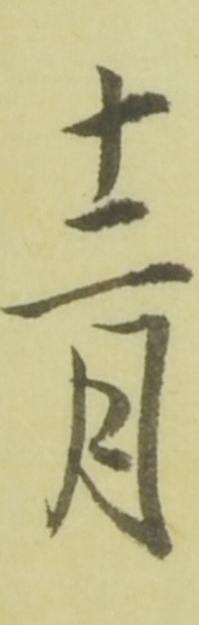十二月
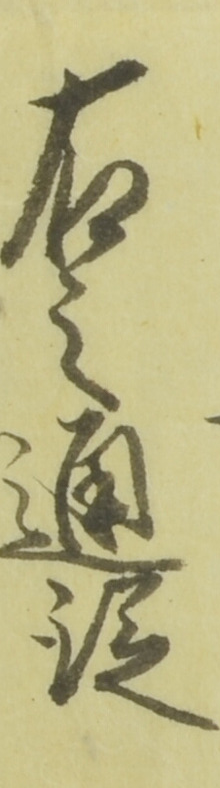右之通従
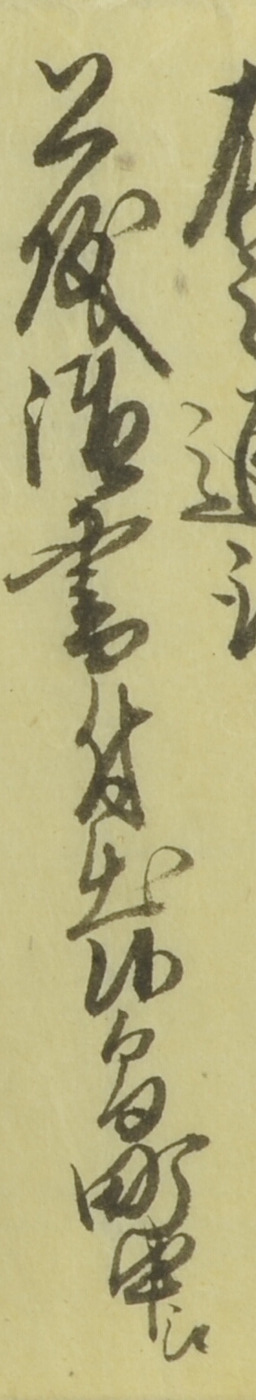公儀御書付出候間町中江
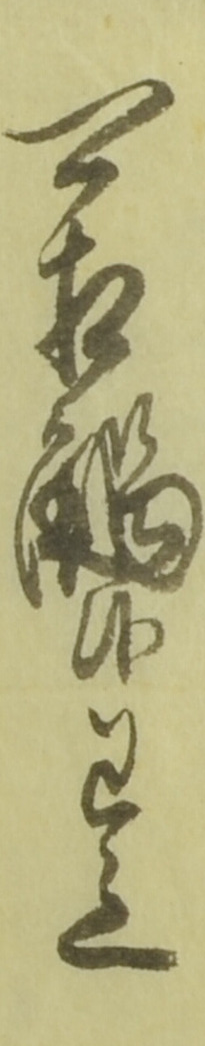可相触候已上
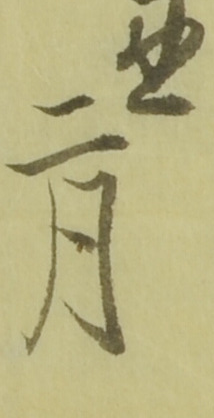十二月
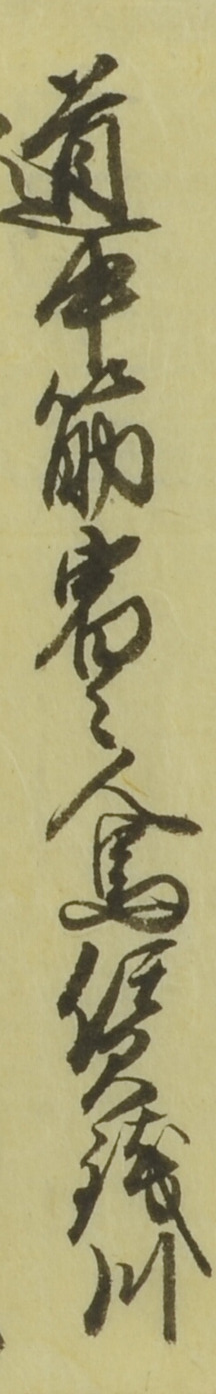道中筋宿々人馬賃銭川
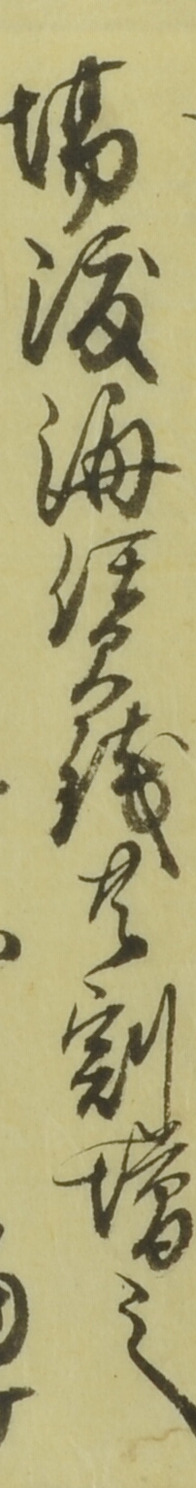場渡海賃銭共割増之
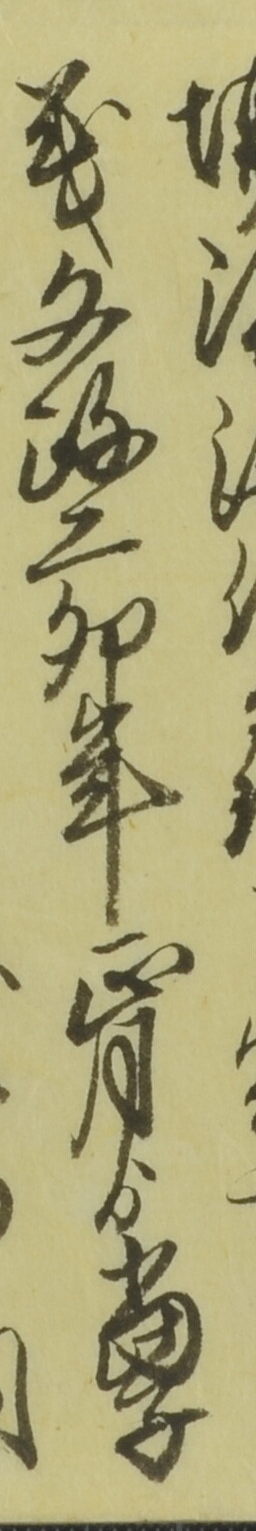義文政二卯年正月ゟ当子
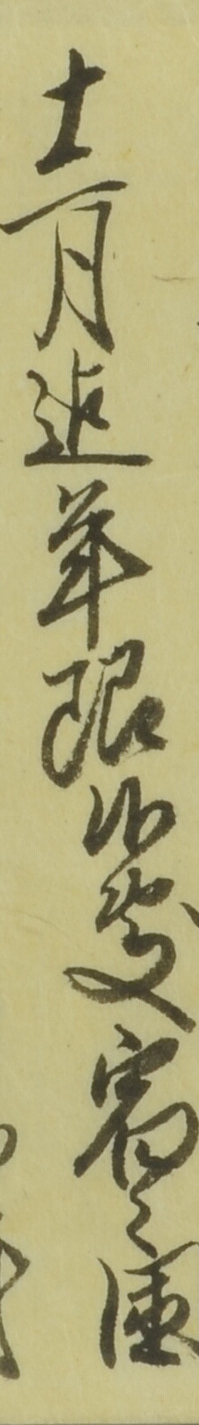十二月迄年限候処宿々困
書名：御触書御書附控
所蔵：伊那市立高遠町図書館・合同会社AMANE
